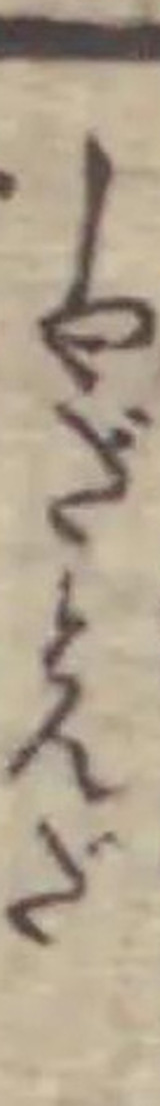しやだとんだ
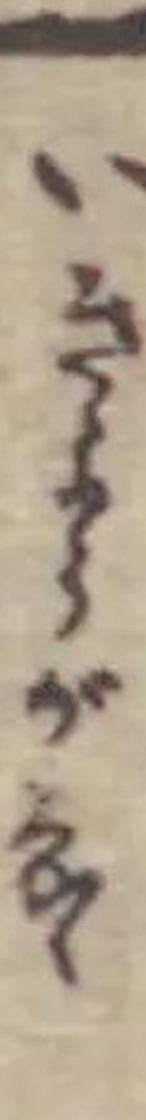いきようがゑゝ
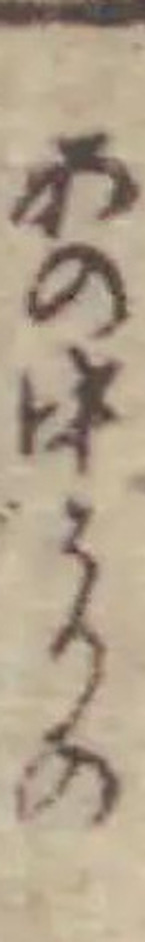あの中うりの
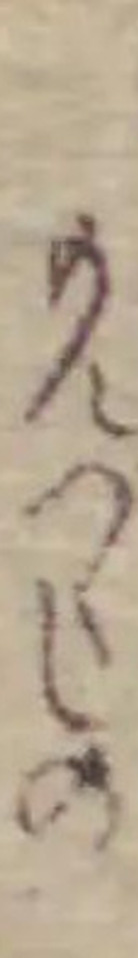もんづくしの
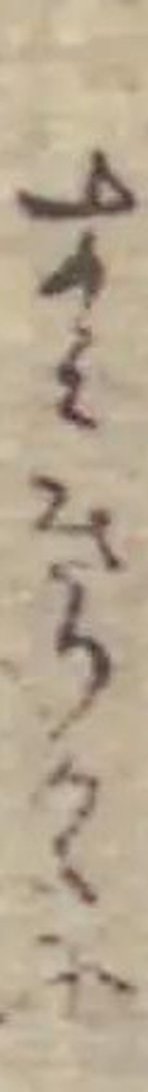すみきりかくに
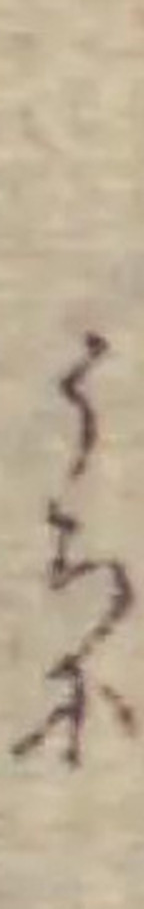うちに
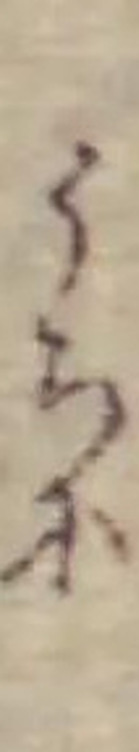うちに
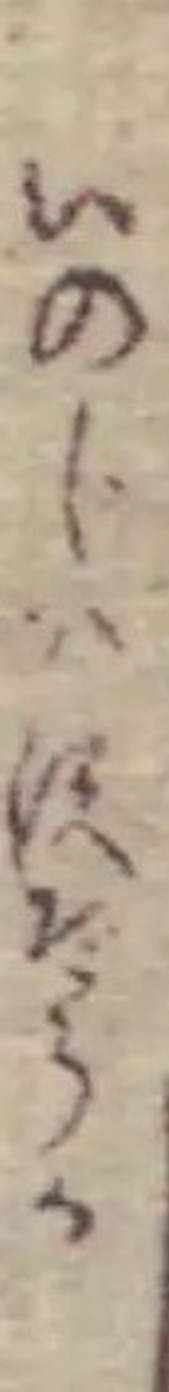いのじは沢？ぞうか
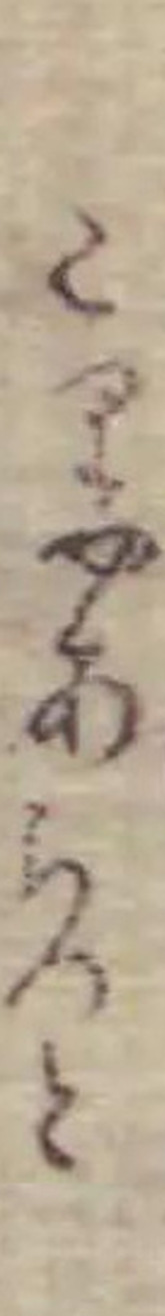こりやあちつと
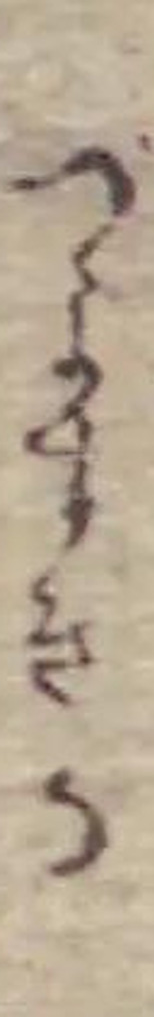つよすきか

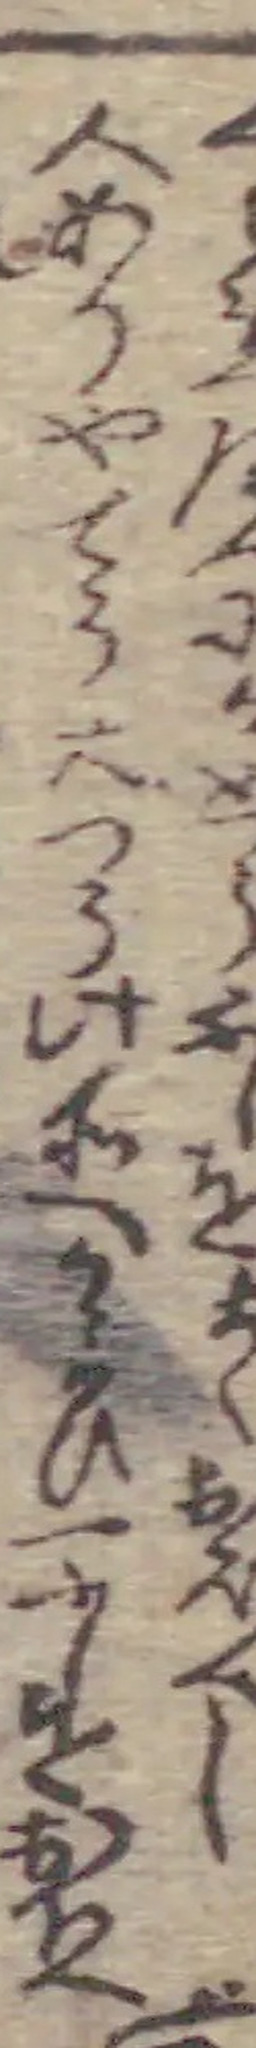人ありやてう大つう此所へかよひ一ふしをおほへ
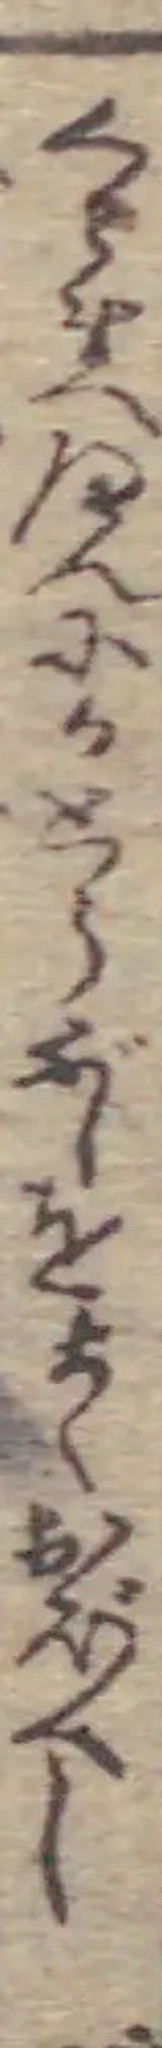くらまへへんにかとうぶしをよくおぼへし
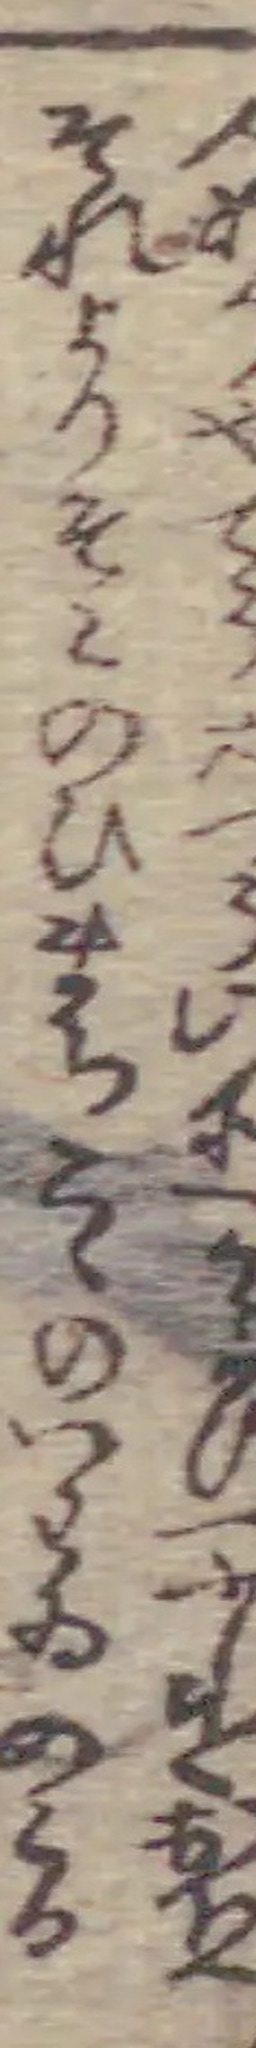それよりそこのひまちこゝのいわゐのこる
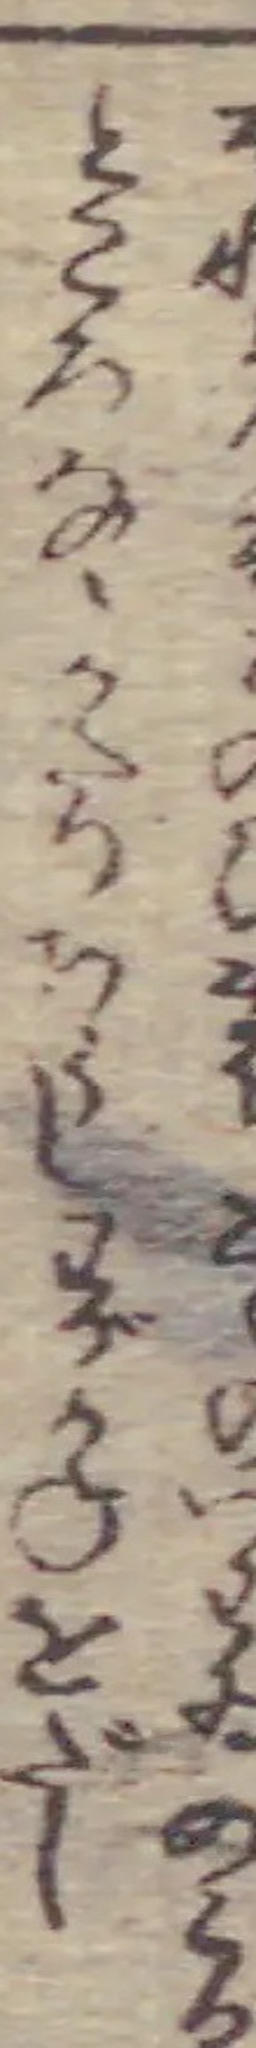ところなくかたりちらしわがかねをだし
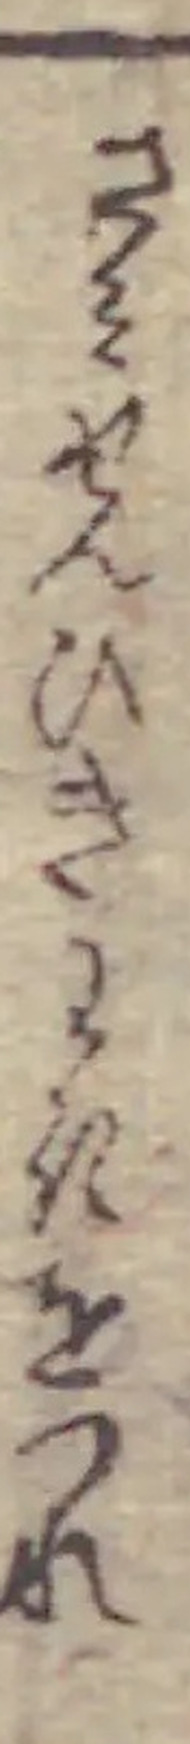さみせんひきわきをつれ
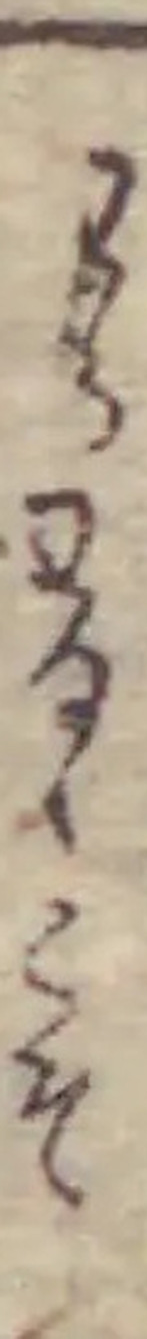わわるゝこそ
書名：夜野中狐物 2巻
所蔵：国立国会図書館 National Diet Library, JAPAN
